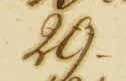29
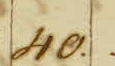40.
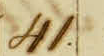41.
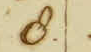8.
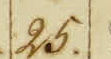25.
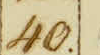40.
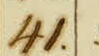41.
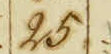25
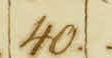40.
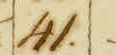41.
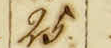25.
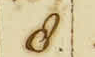8.
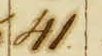41.
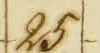25
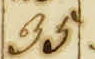35
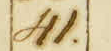41.
